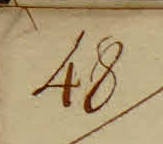48
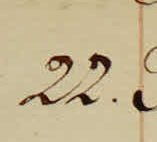22.
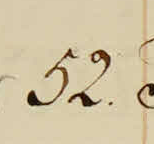52.
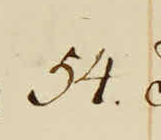54.
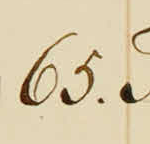65.
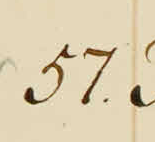57.
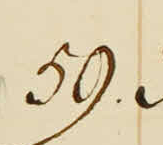59.
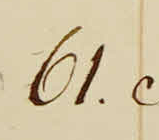61.
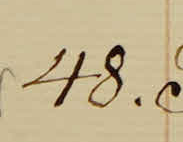48.
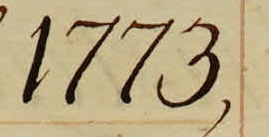1773,
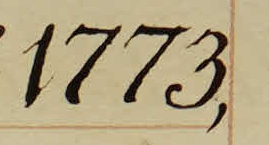1773,
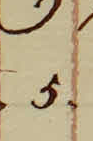5
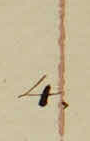4
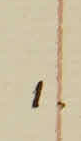1
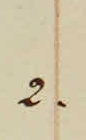2
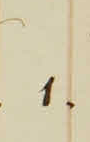1
